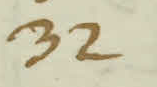32
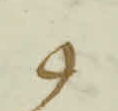9
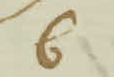6
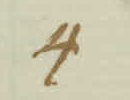4
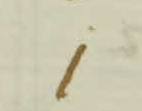1
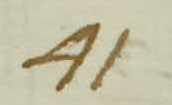41
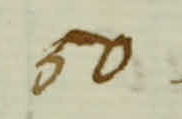50
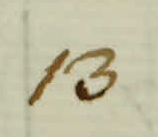13
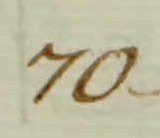70
